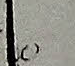0
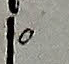0
